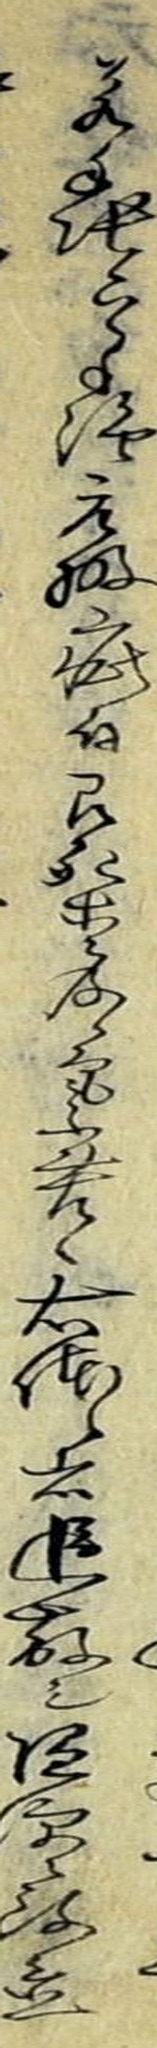若手張候ハヽ手強取扱疵付即死等ニ及候而も不苦候右体之者追散シ温便ニ致置
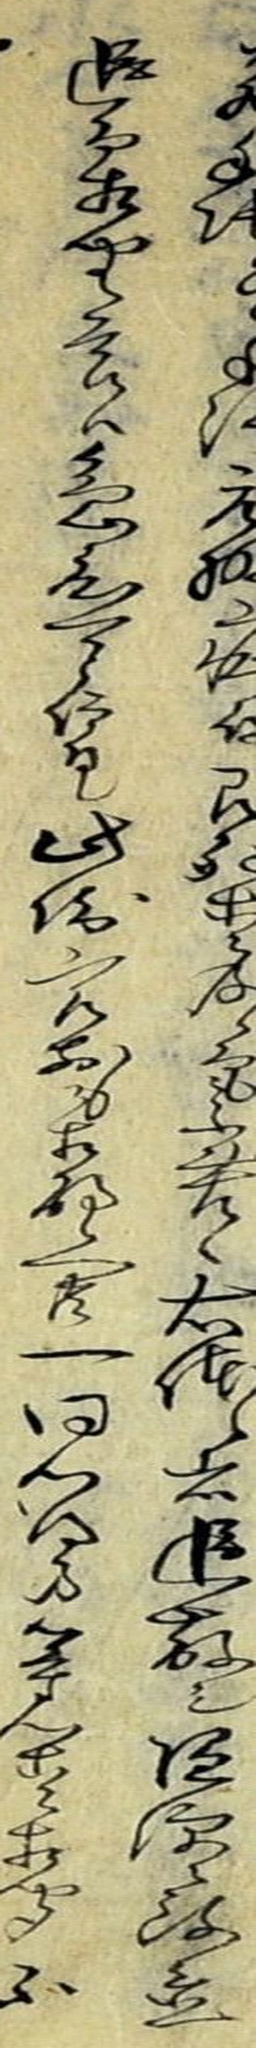追而相聞候節ハ急度可被仰付候此儀最前も相触候へ共一同心得方等閑ニ相聞不
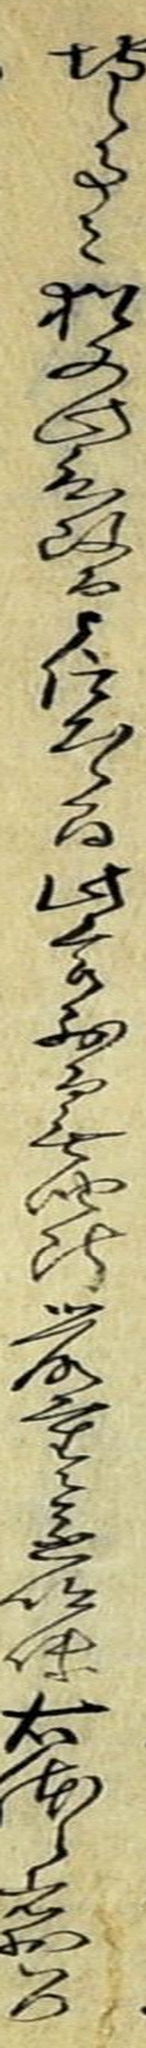埒之事ニ候猶又此度改而被仰出候間此節別而無油断厳重ニ遂吟味右体之者於召
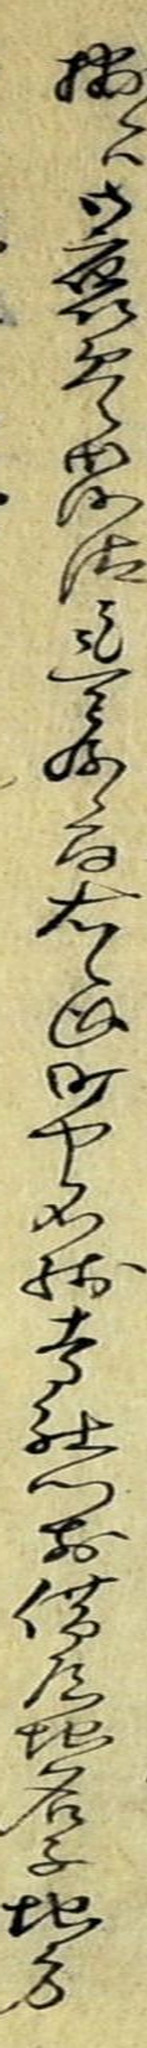捕候ハ御褒美之御沙汰ニも可被及候間右之趣町中不残寺社門前借屋地名子地方
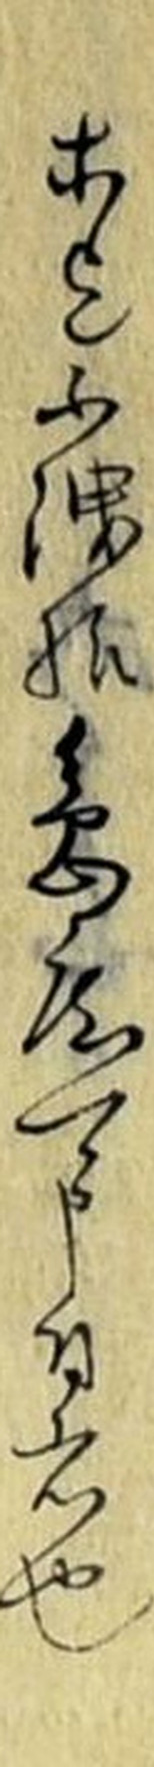等迄不洩様急度可申付者也
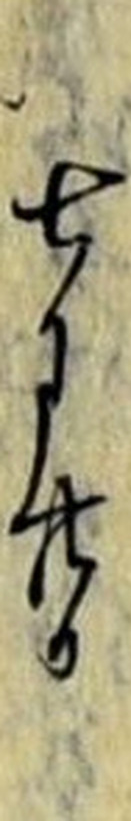七月廿日
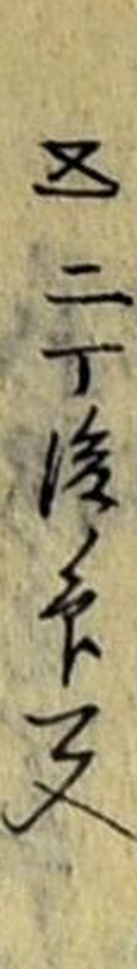△二丁後之印可入

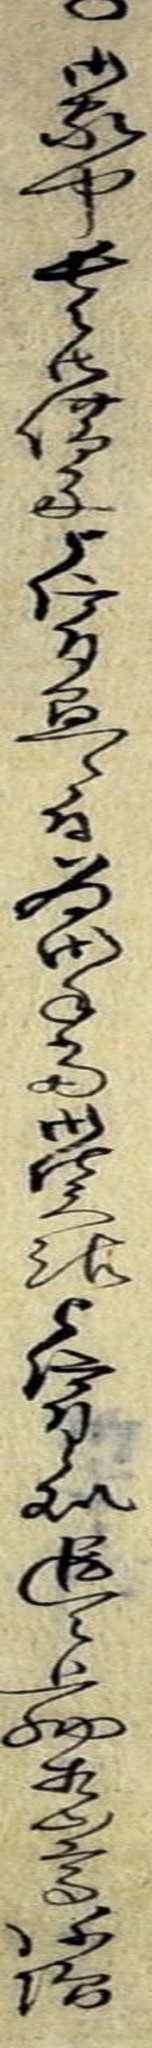〇御家中長々御借米被仰付置候ニ付為御手当御貸銀被仰付候処追々上納相嵩弥増
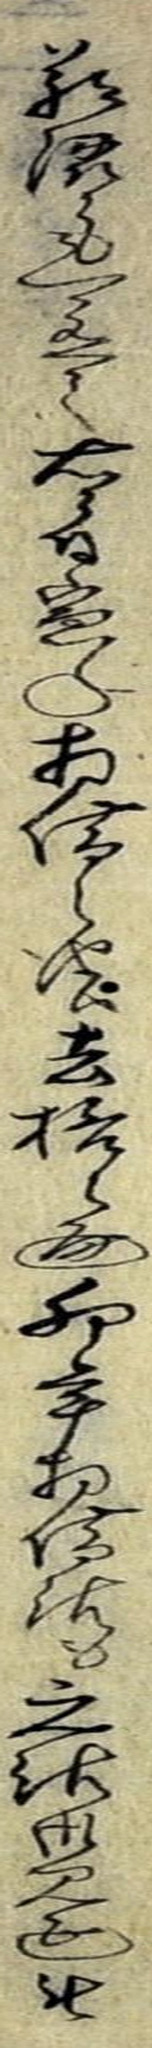難渋ニも可有之右ニ付寅年拝借之儀ハ去格之通卯年拝借銀も元銀御見延被
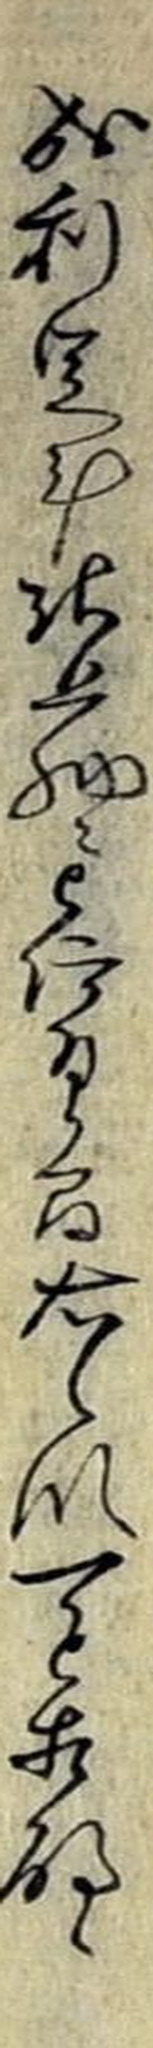成利足斗致上納ニ被仰付候間右之段可被相触候
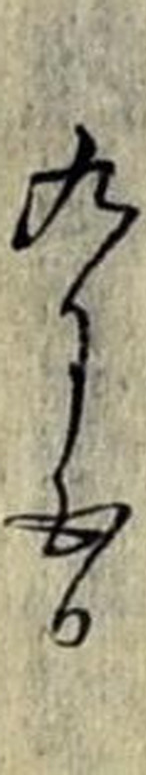九月五日
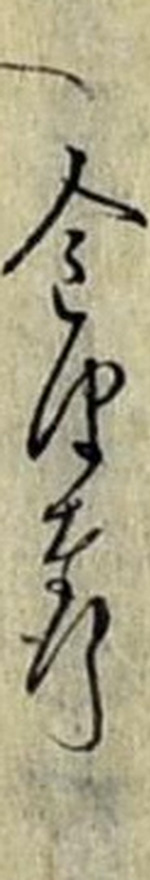金津奉行
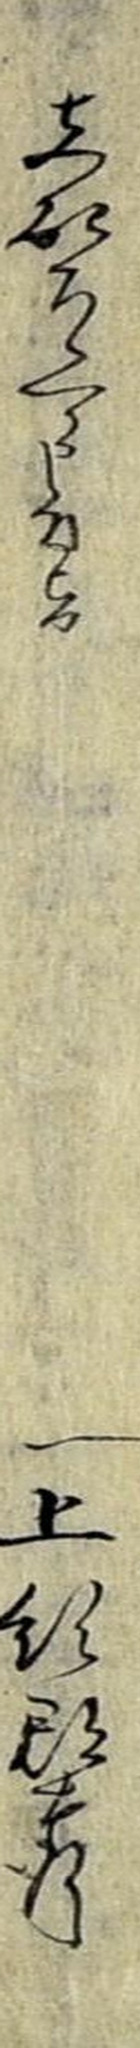支配下へ可申付旨上領郡奉行
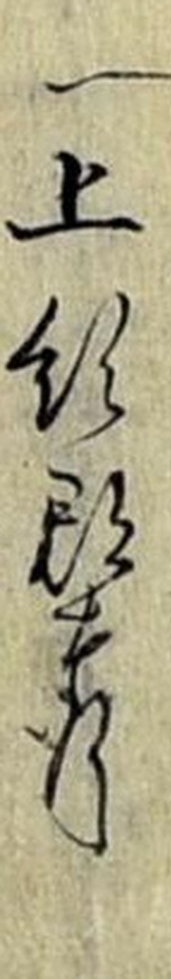中領郡奉行
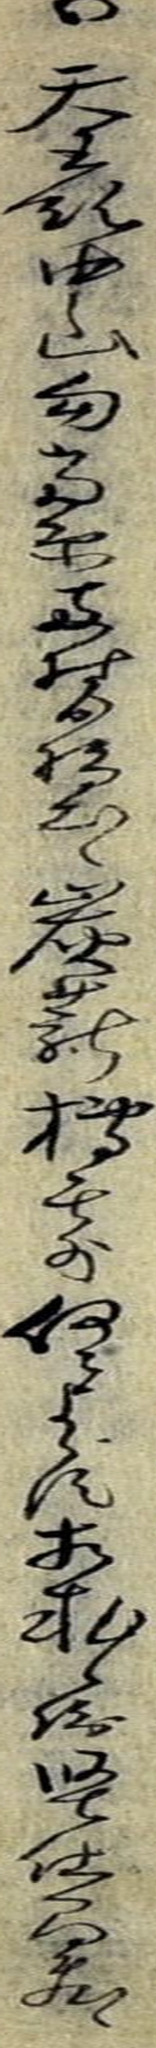〇天王領中山勾当原両村ゟ指出候炭薪樽其外何ニよらす相求候儀堅仕間敷候
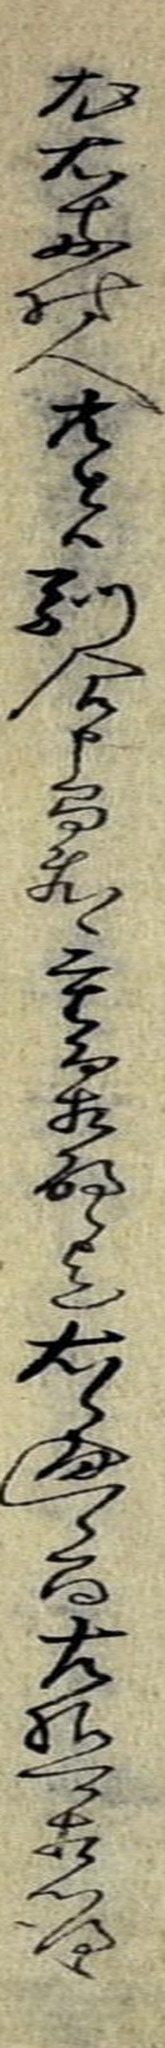尤右両村人共とハ馴合申間敷候重而相触候迄右之通候間左様可相心得候
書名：命令之部 三
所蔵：福井県文書館 Fukui Prefectural Archives
